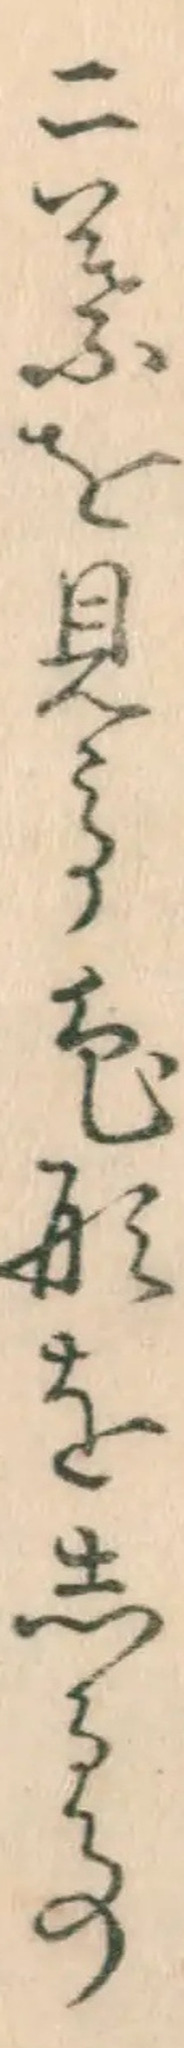二葉を見て花形をしる事
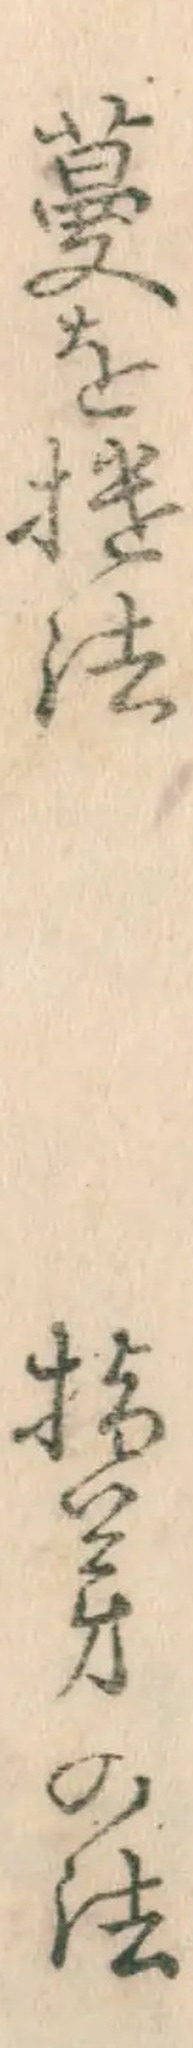蔓を法指芽の法
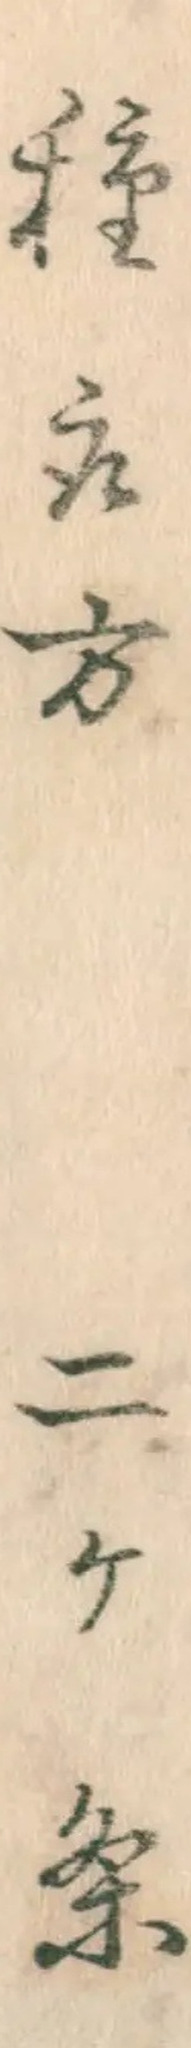種取方二ヶ条
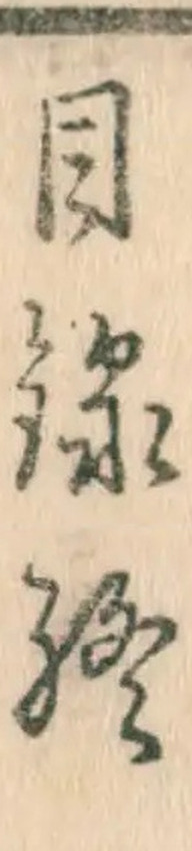目録終

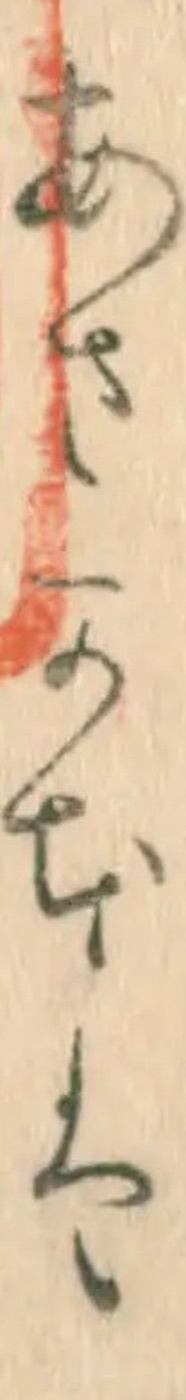あさかほは
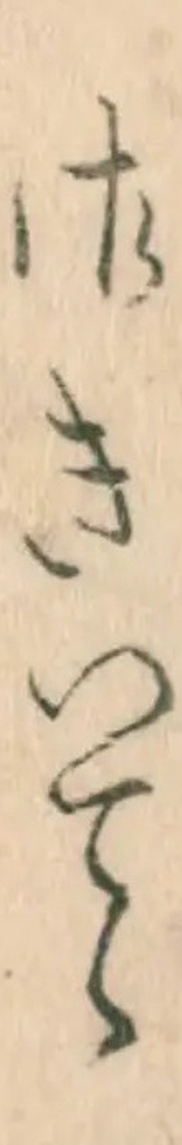さきいてゝ
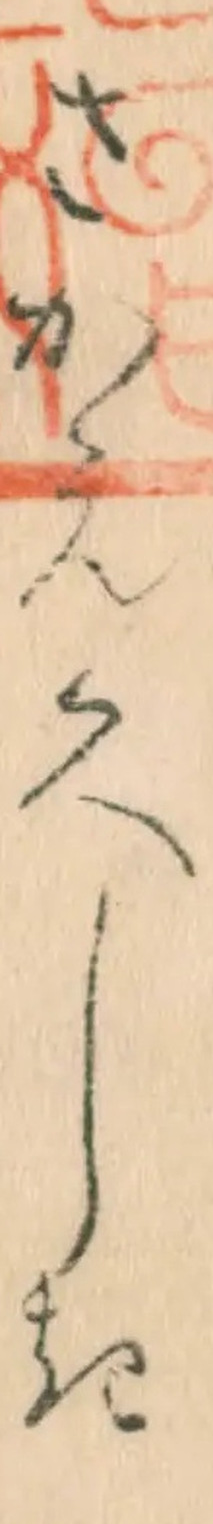さかえ久しき
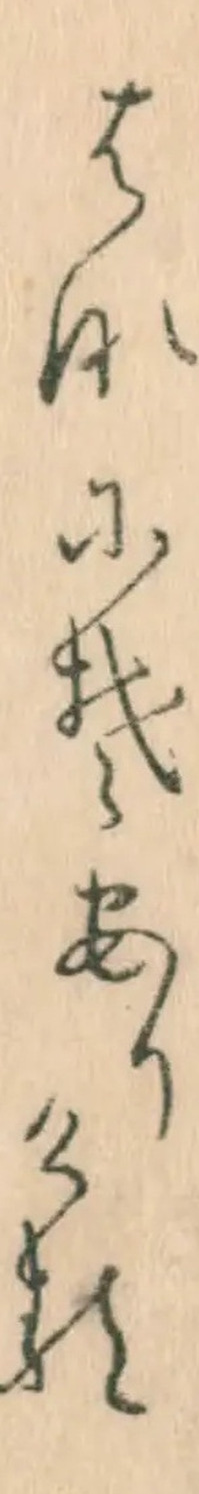はなにそありける
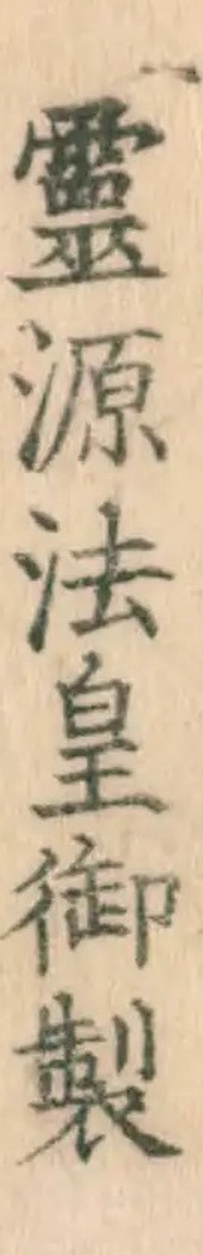霊源法皇御製

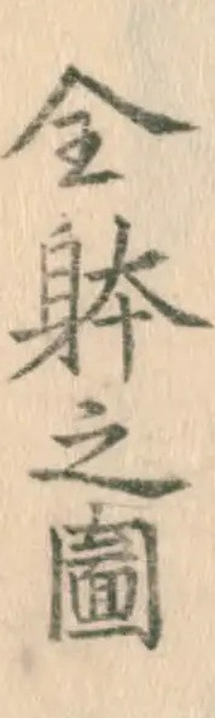全体之図
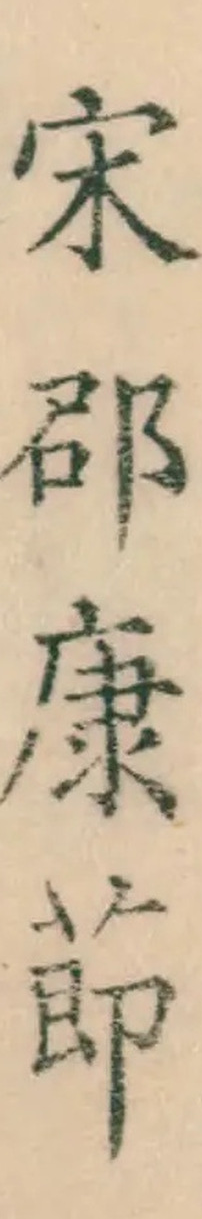宋邵康節

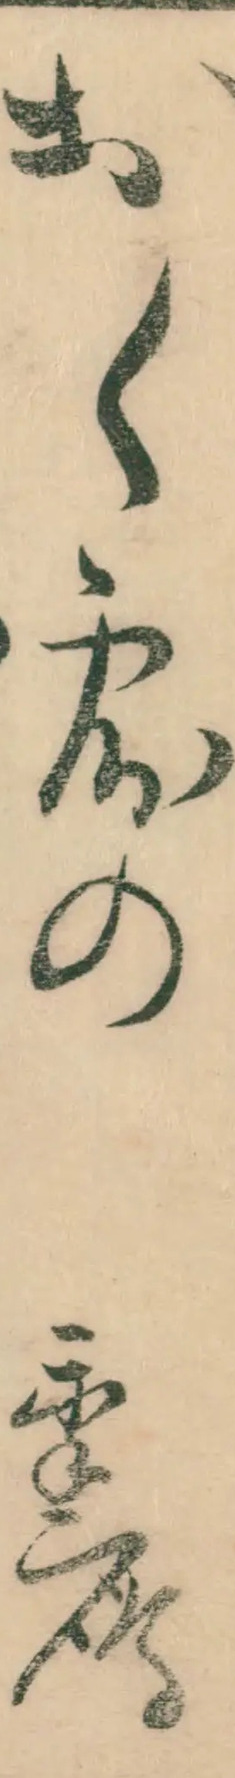おく露の季
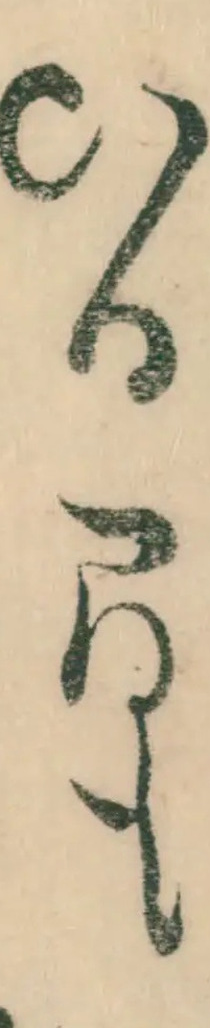いる間も
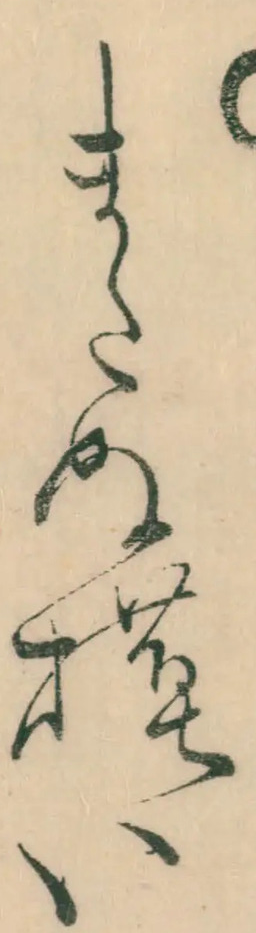またぬ槿は
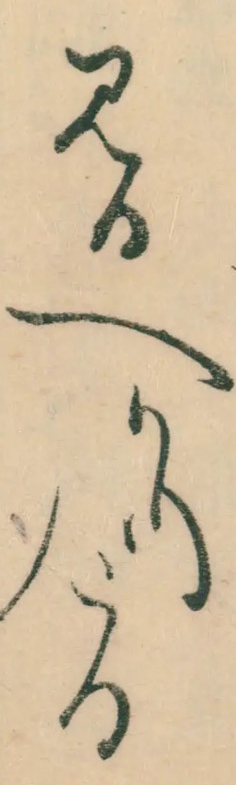見るへかりる
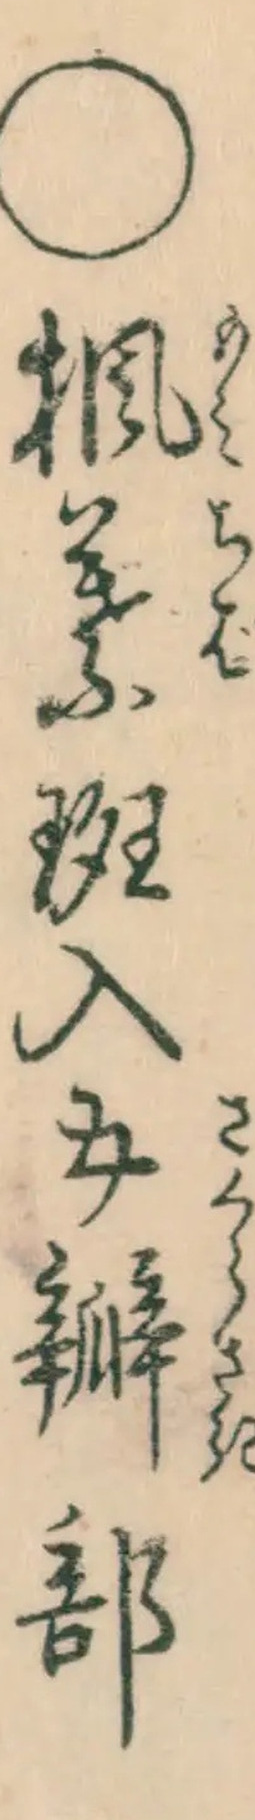○楓葉斑入五弁部
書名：花壇朝顔通 2巻. [1]
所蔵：国立国会図書館 National Diet Library, JAPAN
